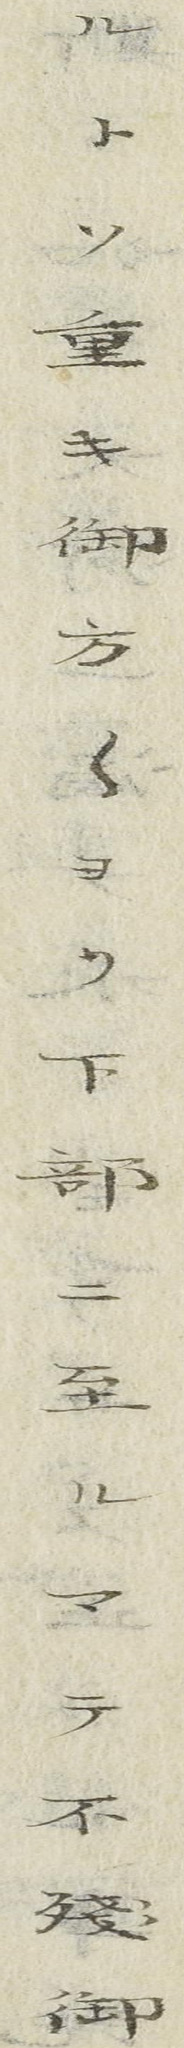ルトソ重キ御方〱ヨリ下部ニ至ルマテ不残御
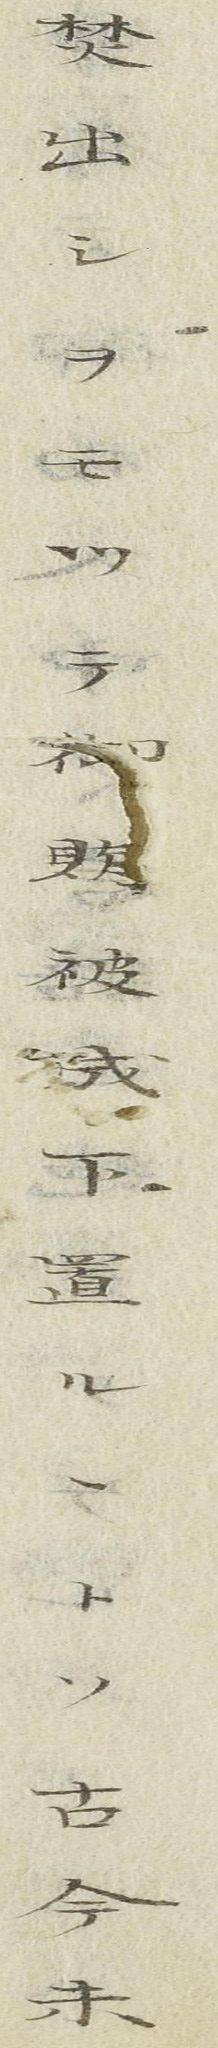焚出シヲモツテ御賄被成下置ルヽトソ古今未

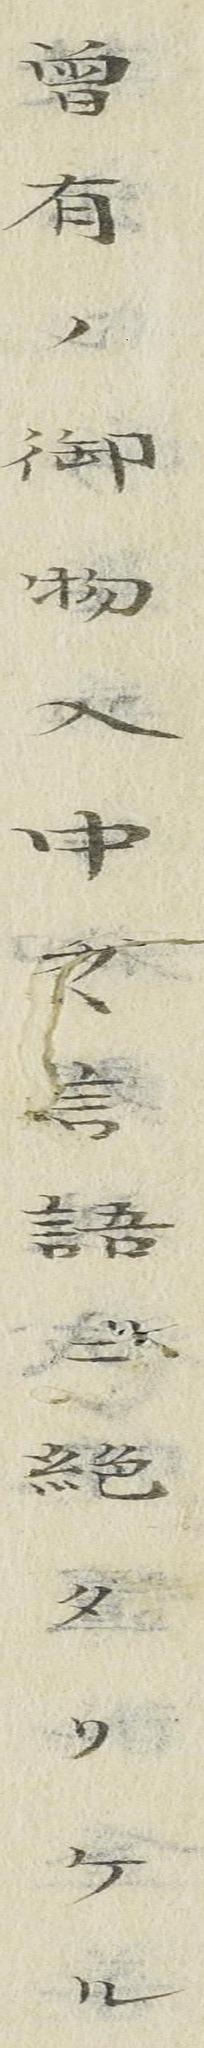曾有ノ御物入中〱言語ニ絶タリケル
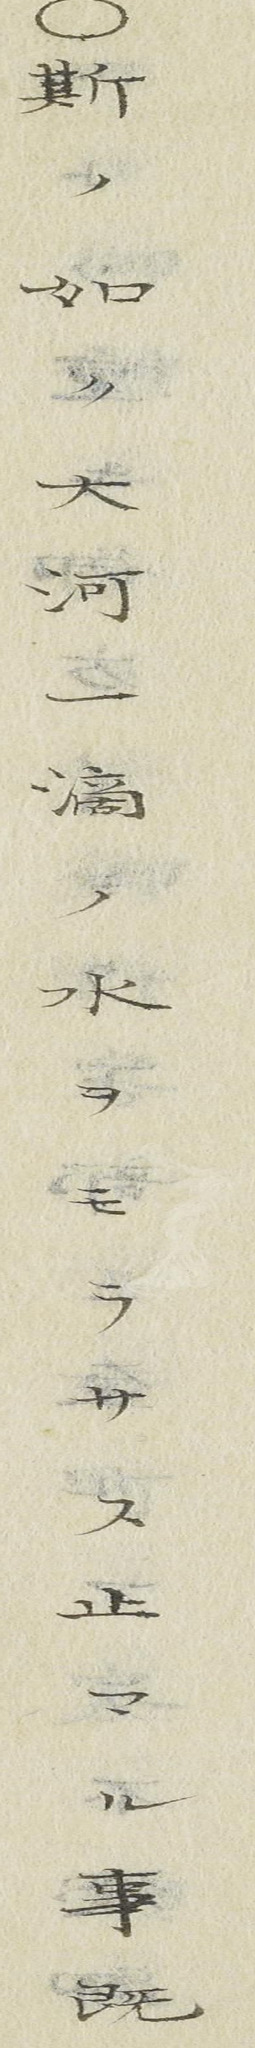〇斯ノ如ク大河一滴ノ水ヲモラサス止マル事既
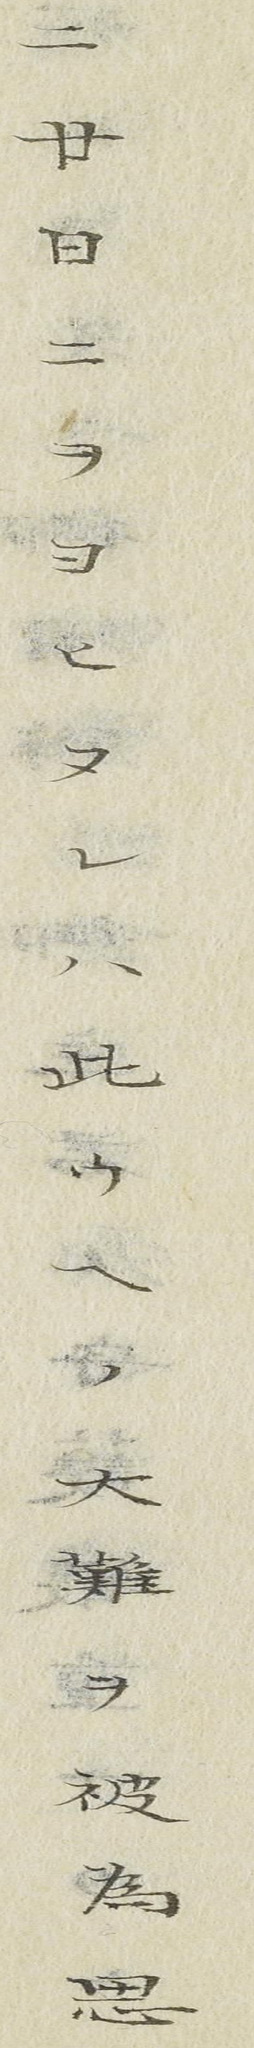ニ廿日ニヲヨヒタレハ此ウヘノ大難ヲ被為思
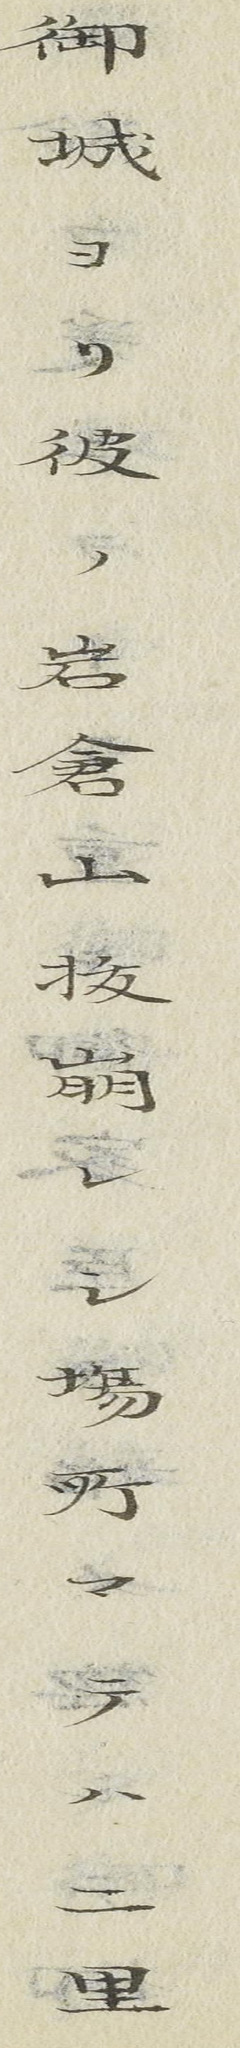御城ヨリ彼ノ岩倉山抜崩レシ場所マテハ二里
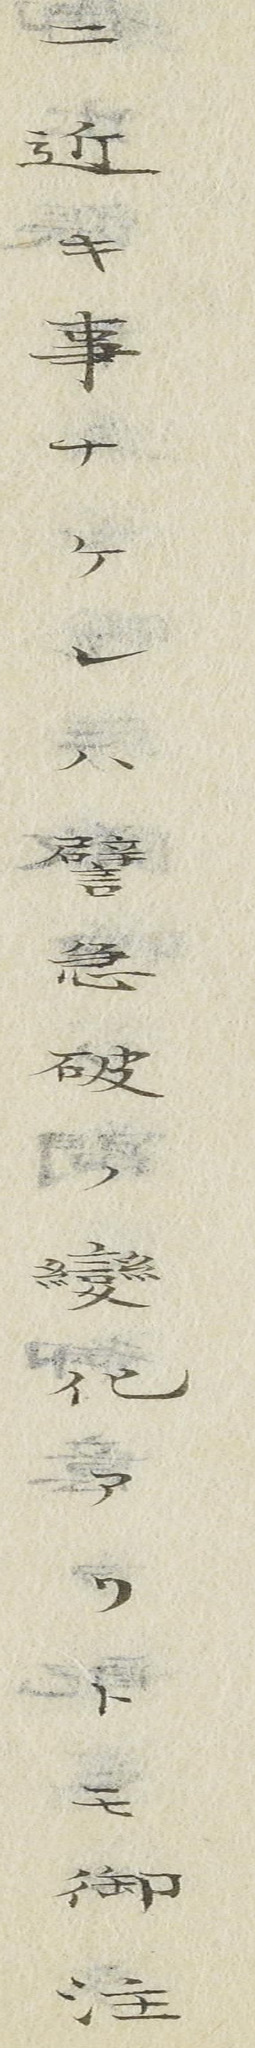ニ近キ事ナケレハ譬急破ノ変化アリトモ御注
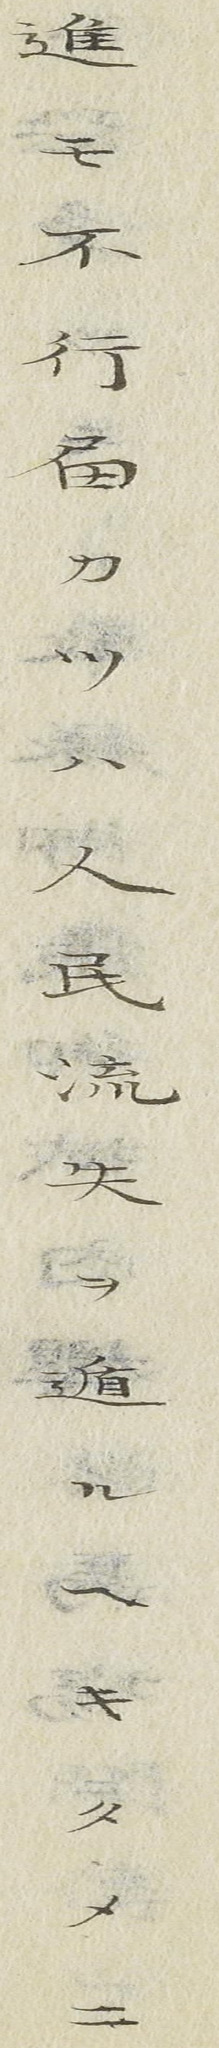進モ不行届カツハ人民流失ノ遁ルヘキタメニ
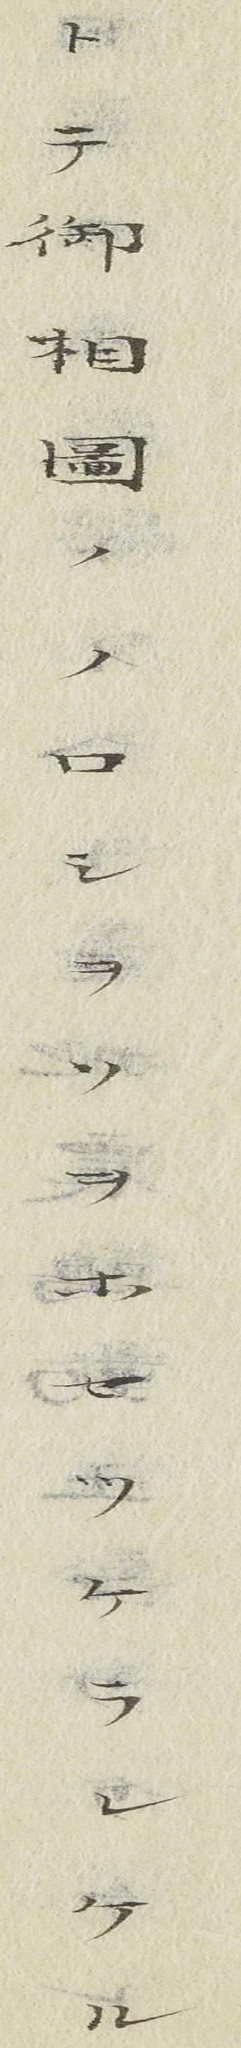トテ御相図ノノロシヲソヲホセツケラレケル
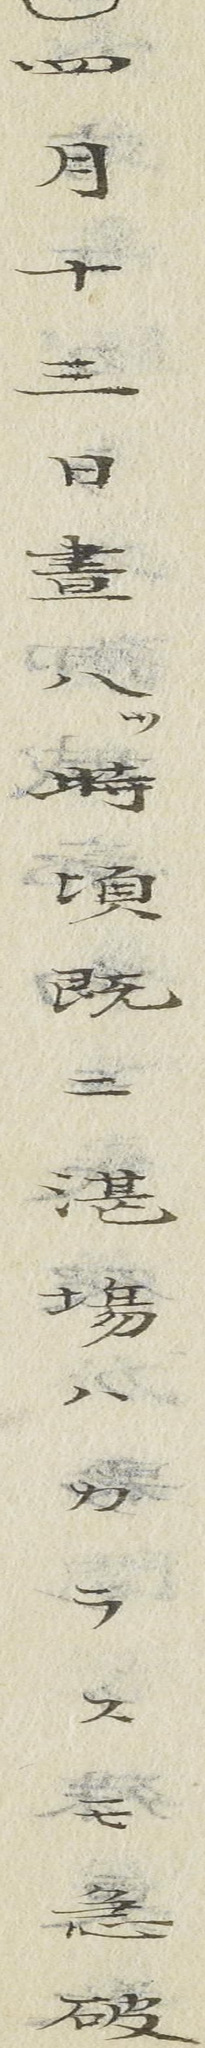〇四月十三日昼八ツ時頃既ニ湛場ハカラスモ急破
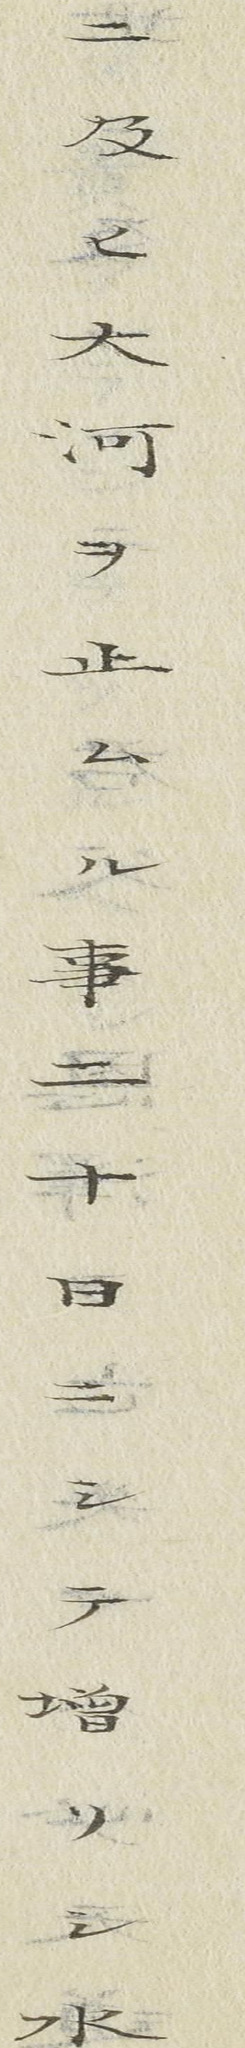ニ及ヒ大河ヲ止ムル事二十日ニシテ増リシ水
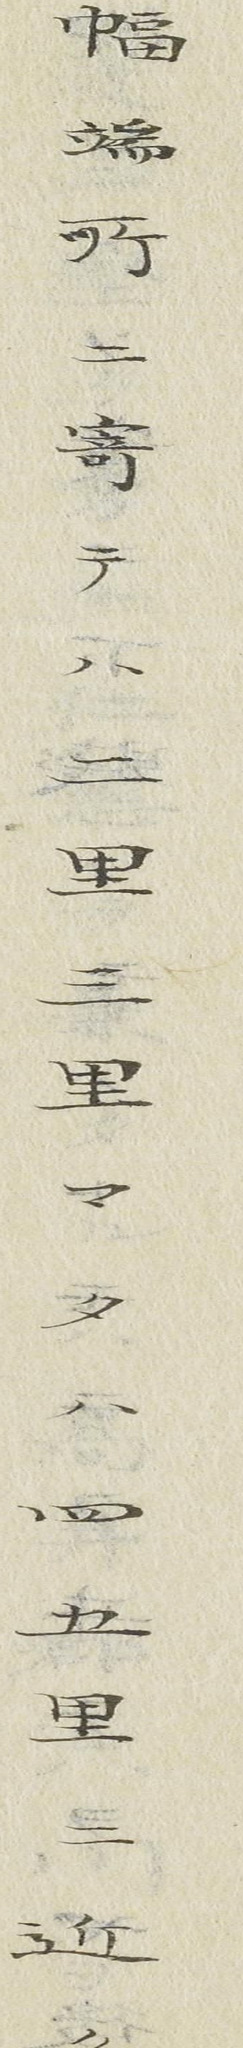幅端所ニ寄テハ二里三里マタハ四五里ニ近ク
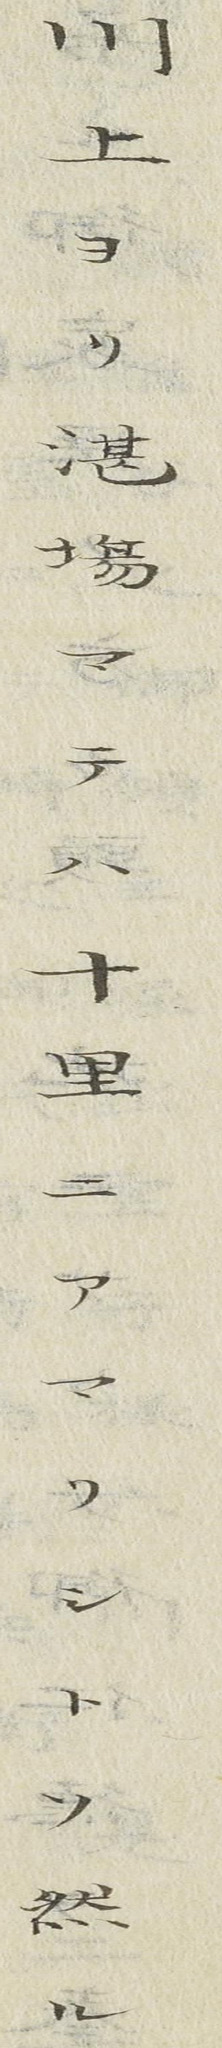川上ヨリ湛場マテハ十里ニアマリシトソ然ル
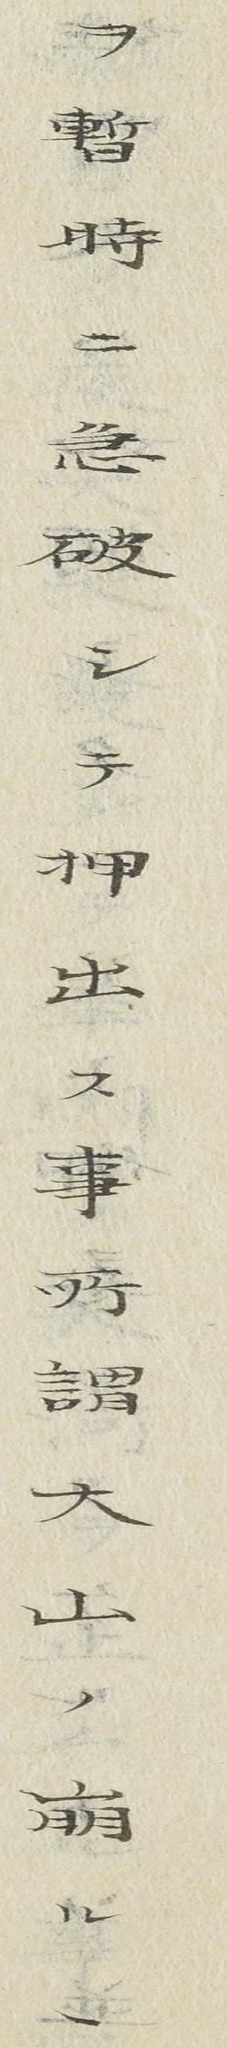ヲ暫時ニ急破シテ押出ス事所謂大山ノ崩ルヽ
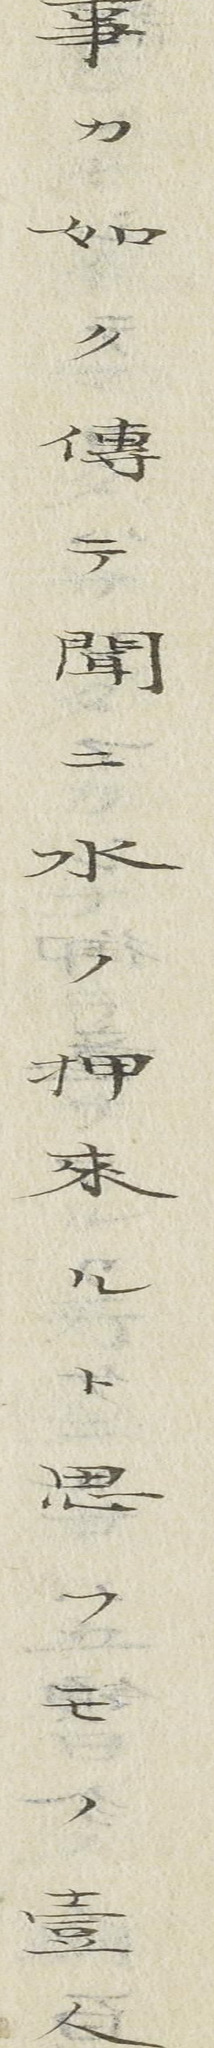事カ如ク伝テ聞ニ水ノ押来ルト思フモノ一人
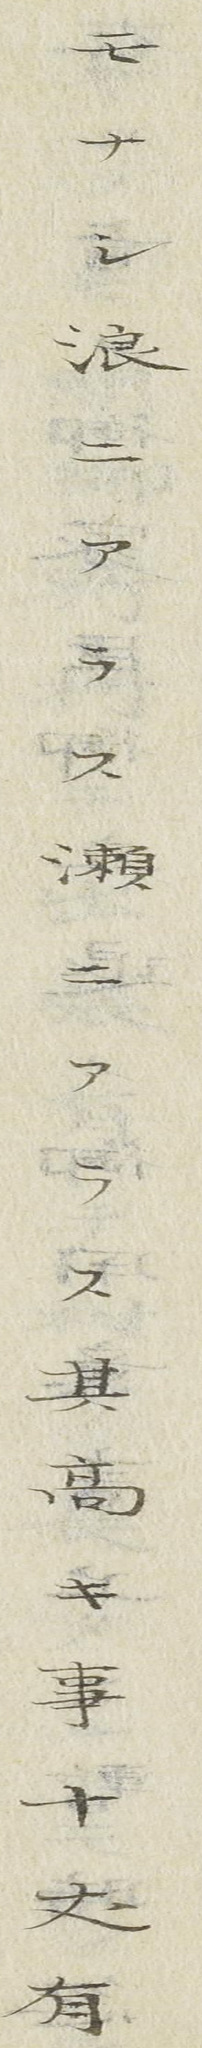モナシ浪ニアラス瀬ニアラス其高キ事十丈有
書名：地災撮要　地震之部　巻ノ二
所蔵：東京大学地震研究所図書室 Earthquake Research Institute Library, The University of Tokyo, JAPAN
